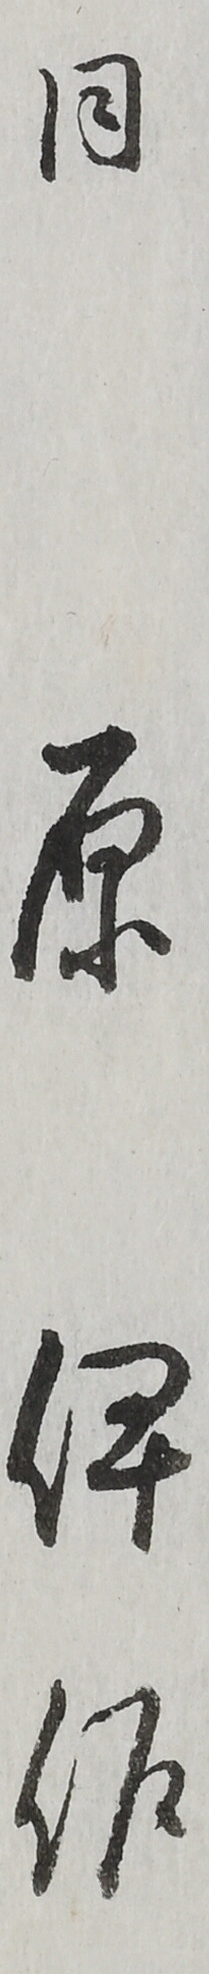同原伊作
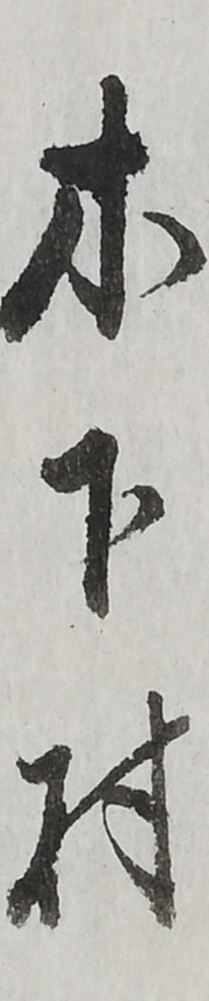木下村
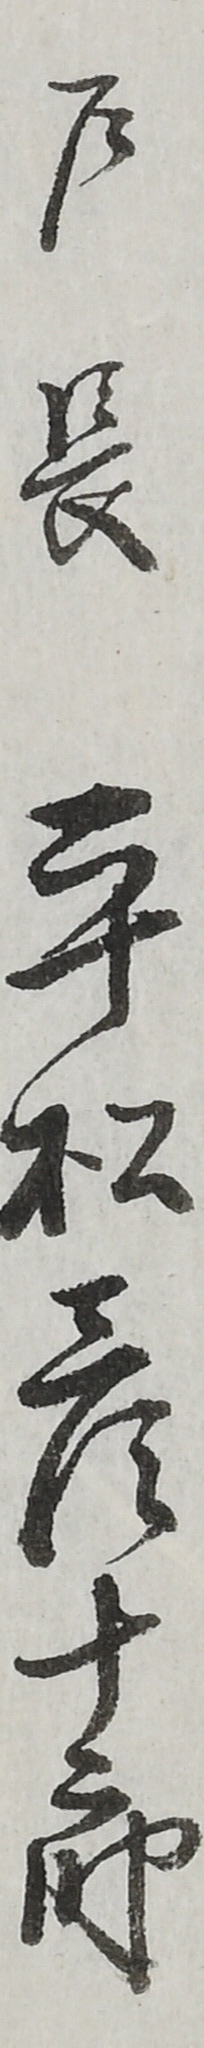戸長平松彦十郎
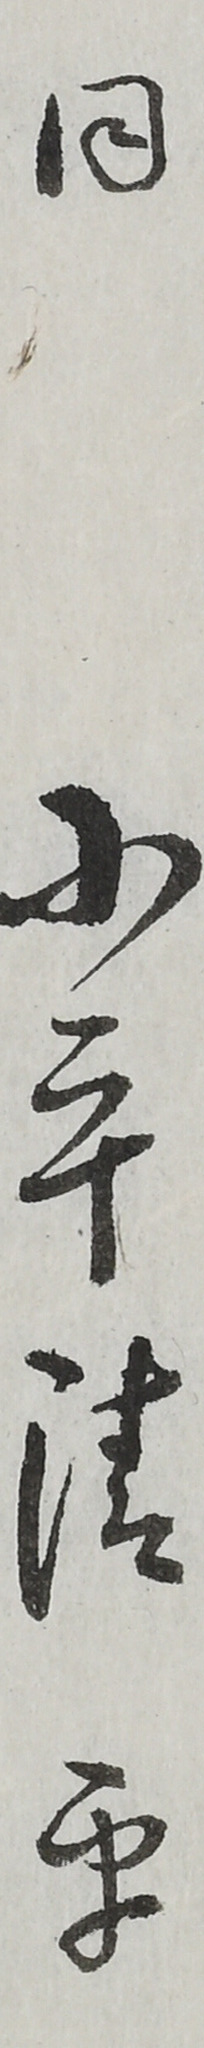同小平清平
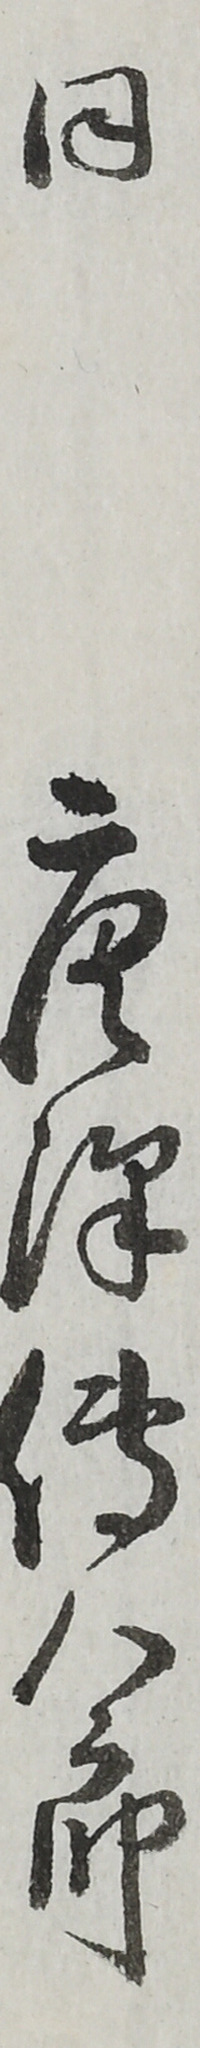同唐澤伝八郎
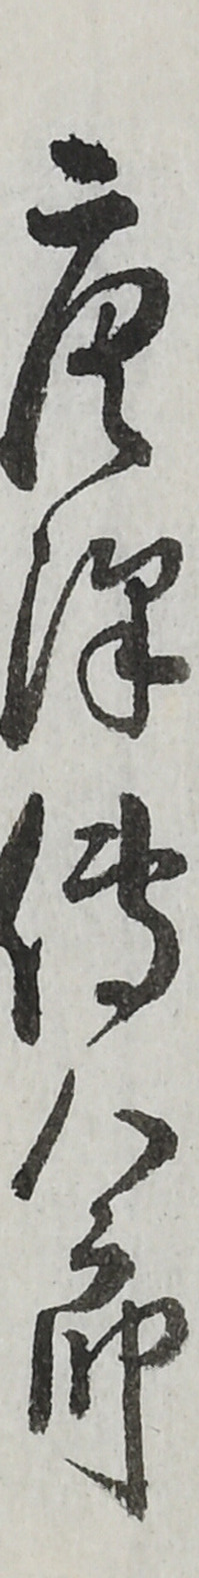同唐澤伝八郎
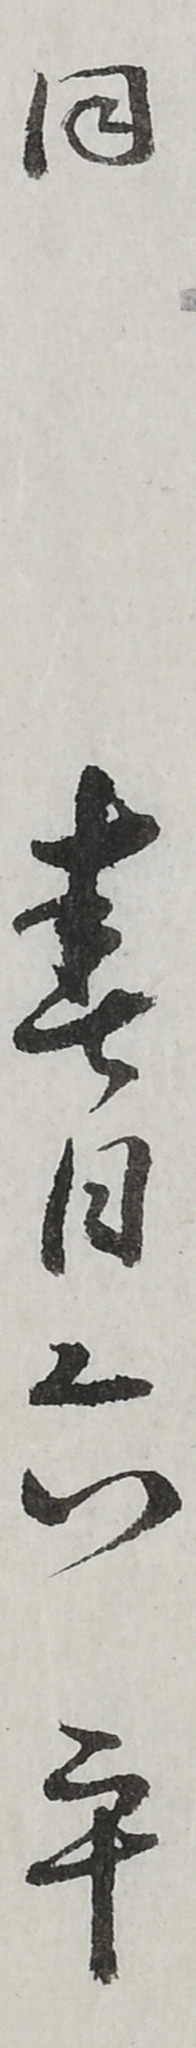同春日六平
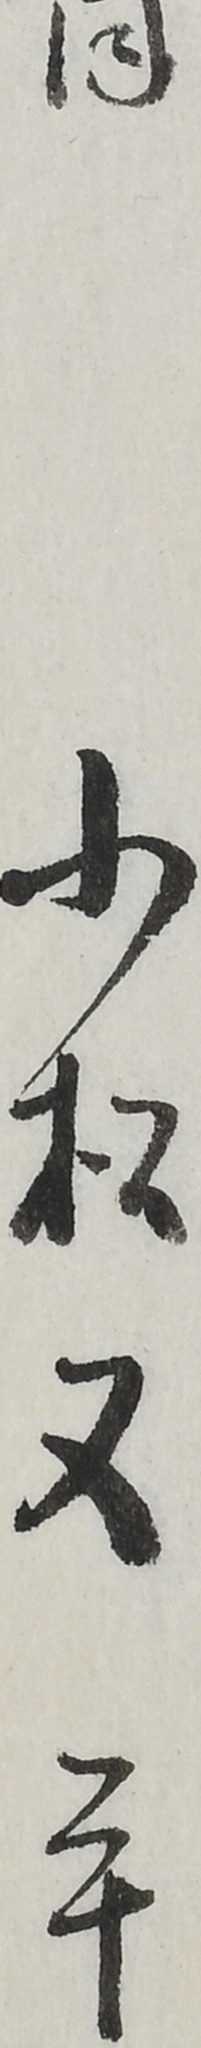同小松又平

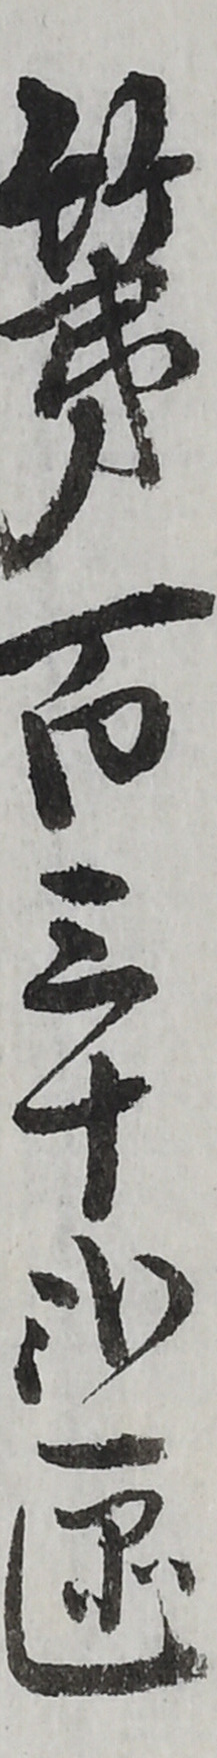第百三十弐区
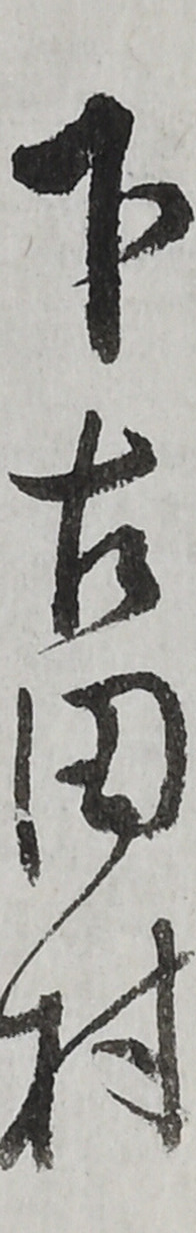下古田村
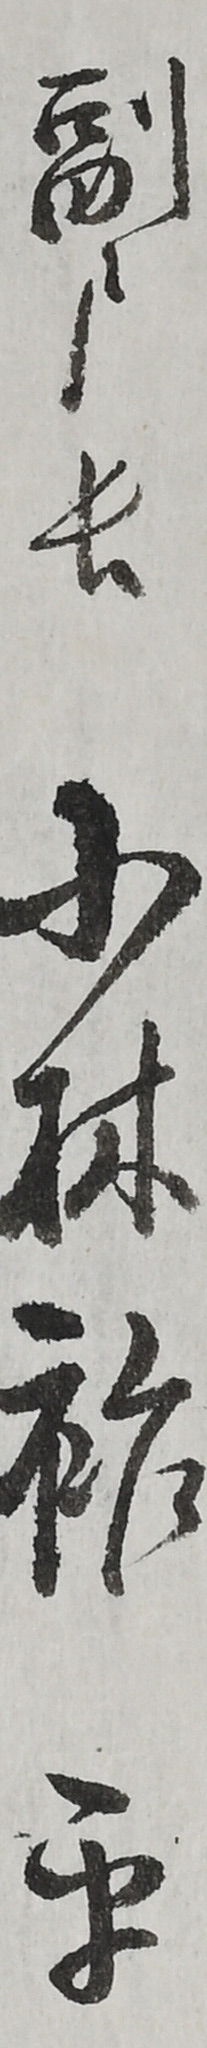副戸長小林祚平
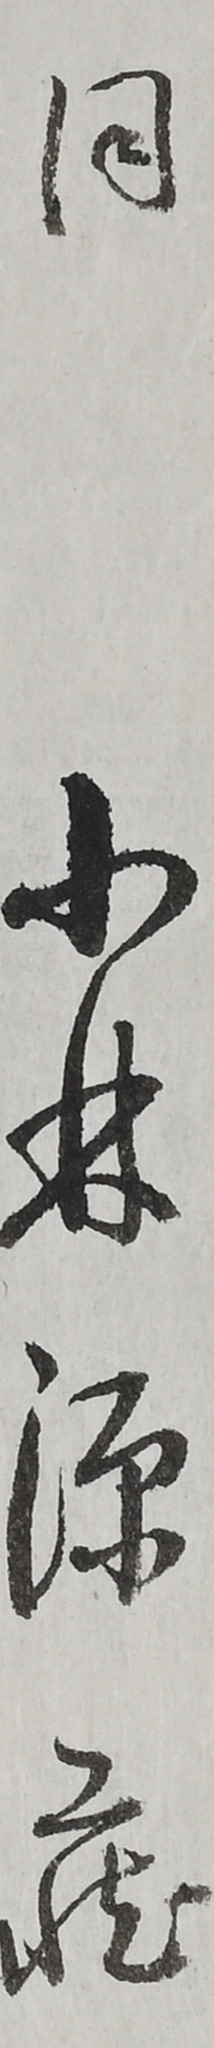同小林源蔵
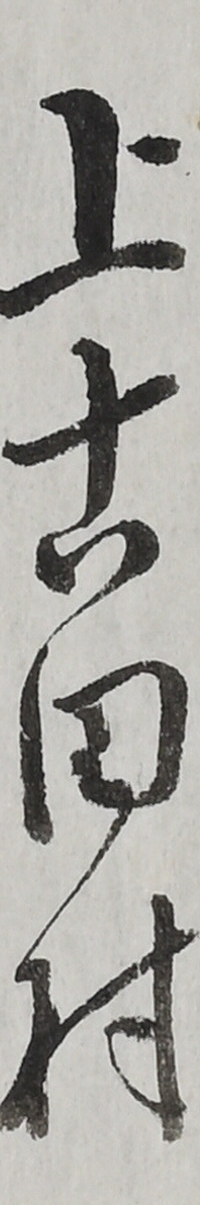上古田村
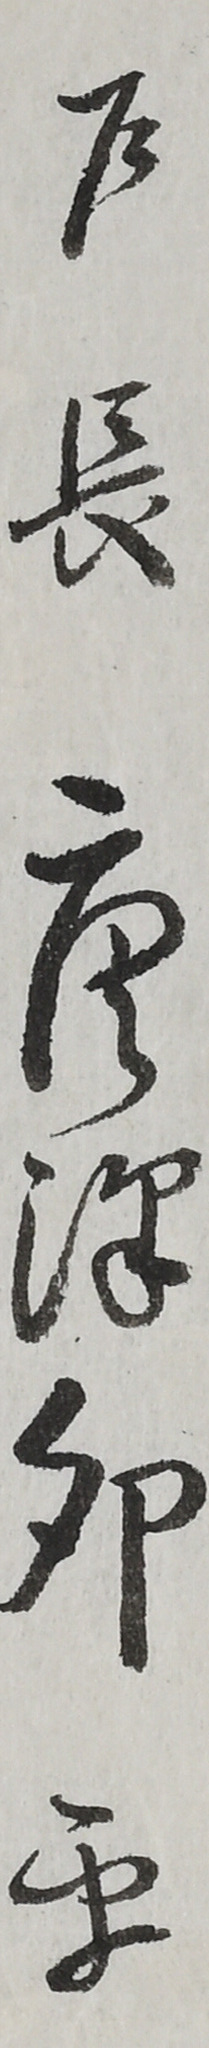戸長唐澤卯平
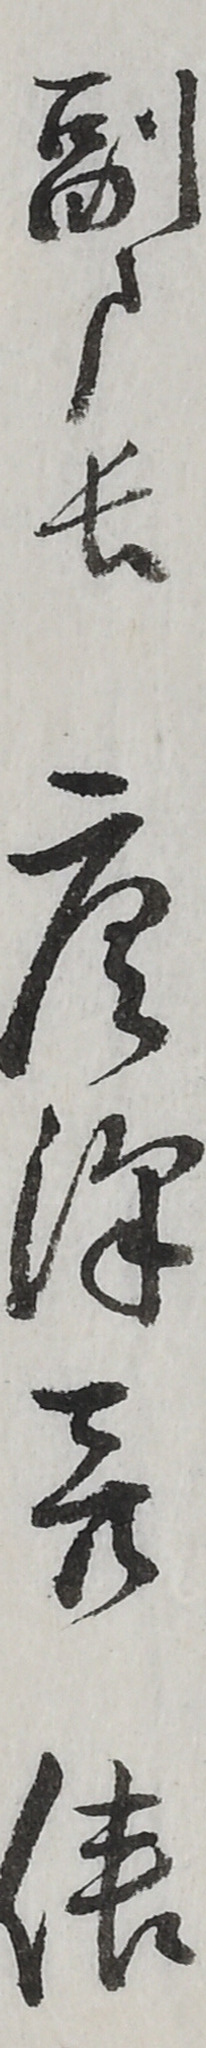副戸長唐澤喜俵
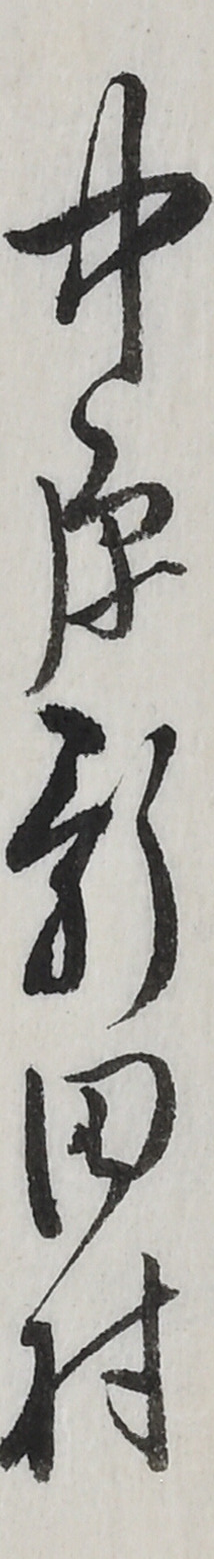中原新田村
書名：伊那郡毎村戸長副戸長名簿
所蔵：伊那市立高遠町図書館・合同会社AMANE
